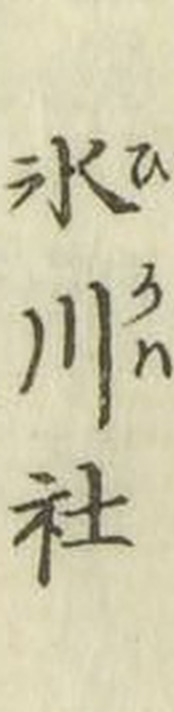氷川社

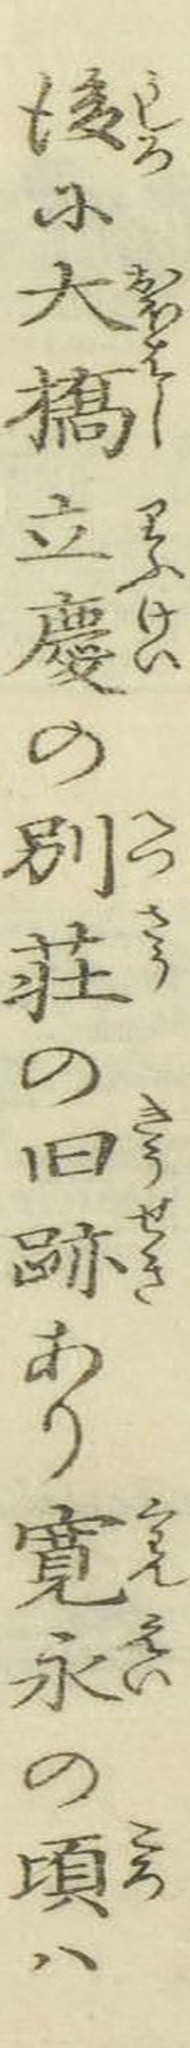後に大橋立慶の別荘の旧跡あり寛永の頃は
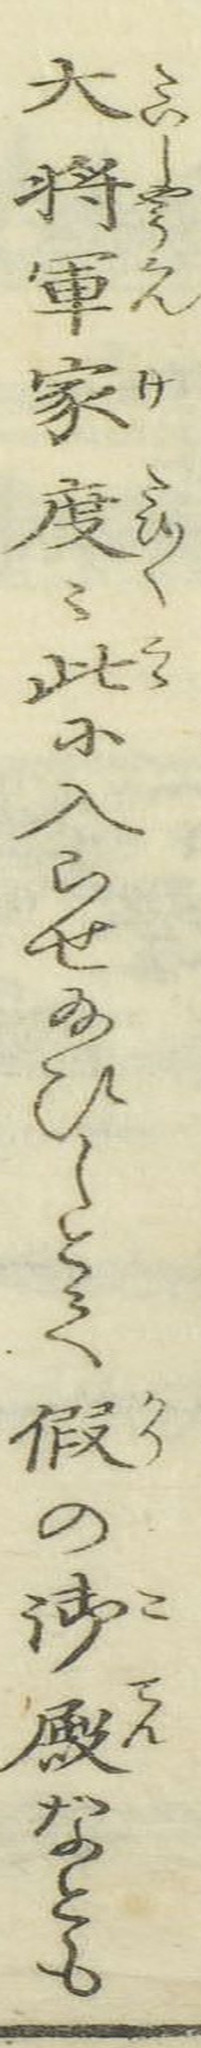大将軍家度々此に入らせ給ひしとて假の御殿なとも
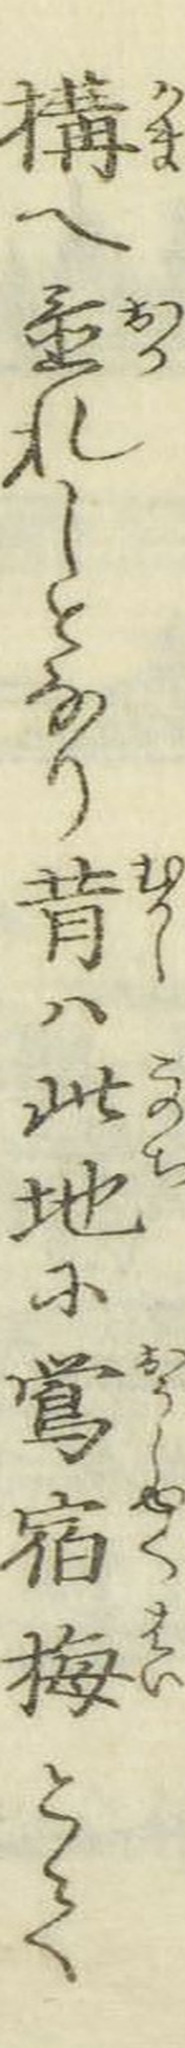搆へ置れしとなり昔は此地に鴬宿梅とて
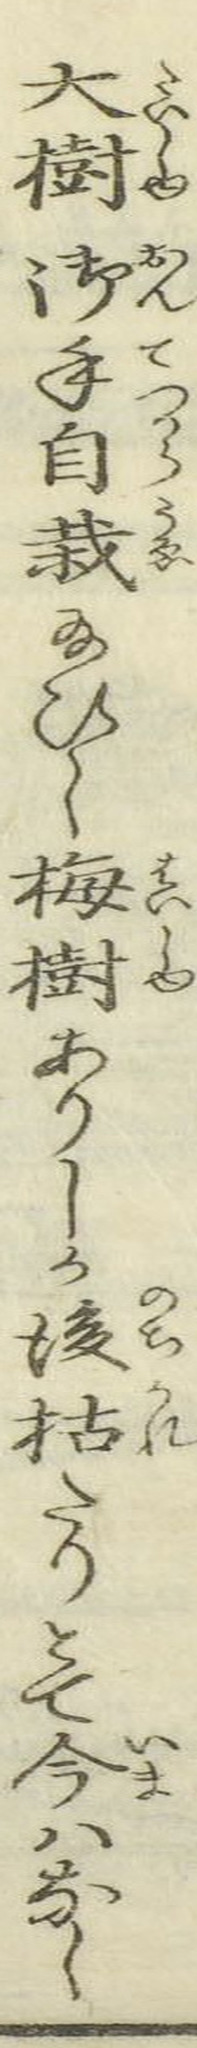大樹御手自栽給ひし梅樹ありしか後枯たりとて今はなし
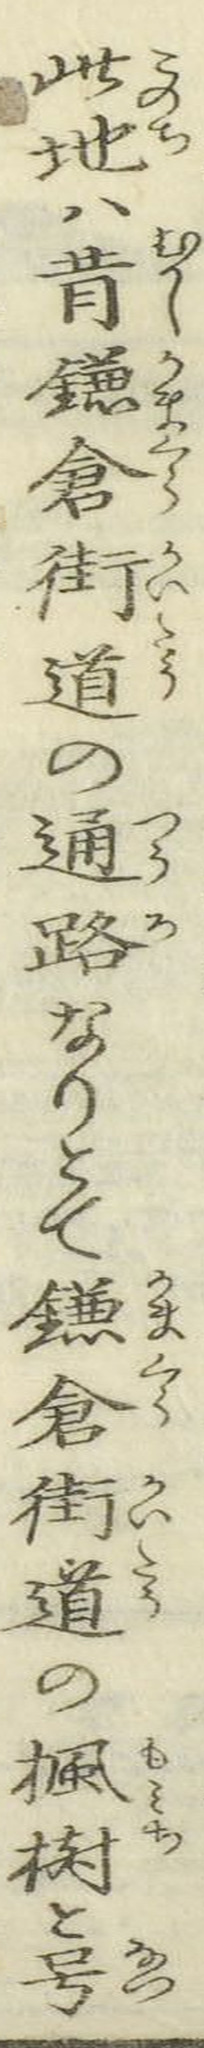此地は昔鎌倉街道の通路なりとて鎌倉街道の楓樹と号
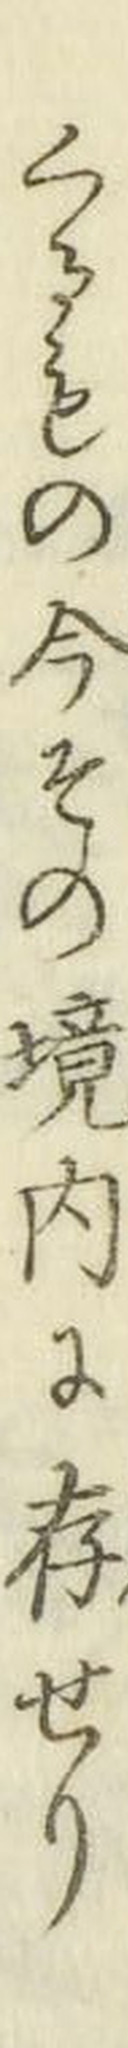くるもの今その境内に存せり
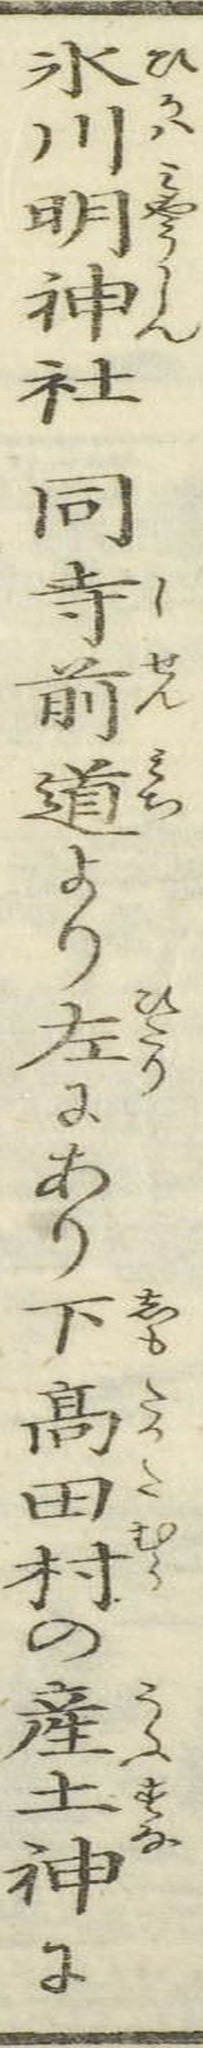氷川明神社同寺前道より左にあり下髙田村の産土神に
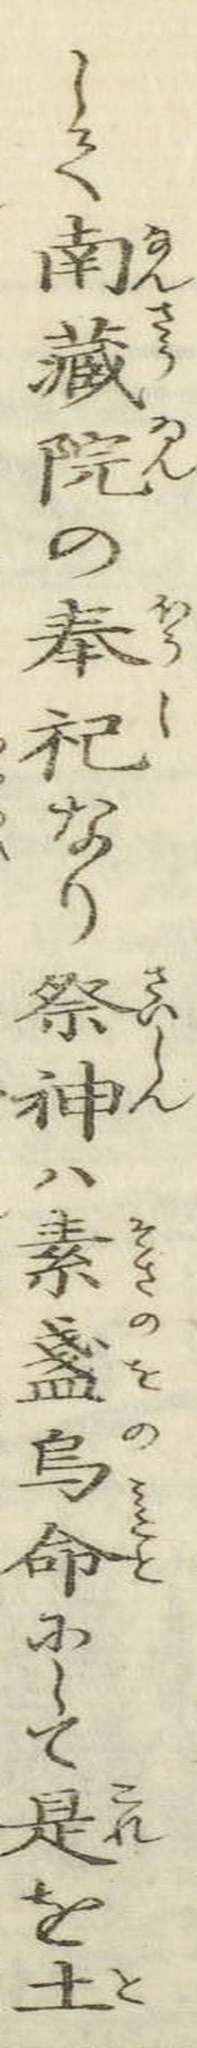して南藏院の奉祀なり祭神は素盞烏尊にして是を土
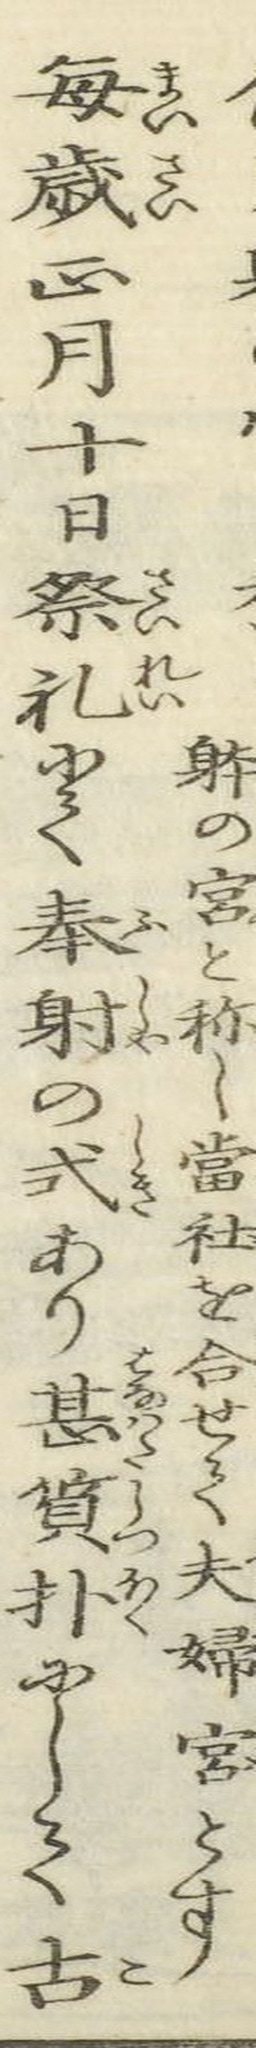毎歳正月十日祭礼にて奉射の式あり甚質朴にして古
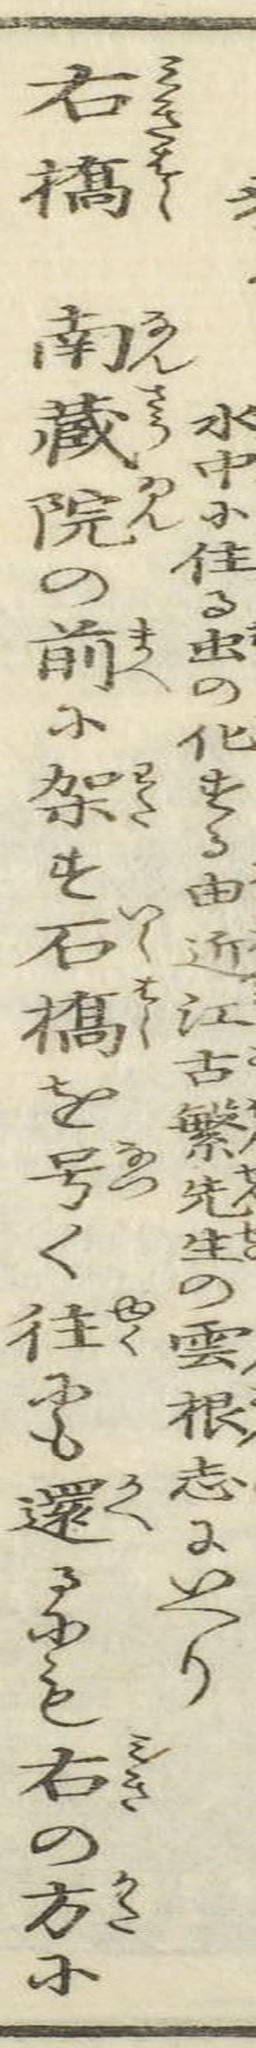右橋南藏院の前に架す石橋を号く往にも還るにも右の方に
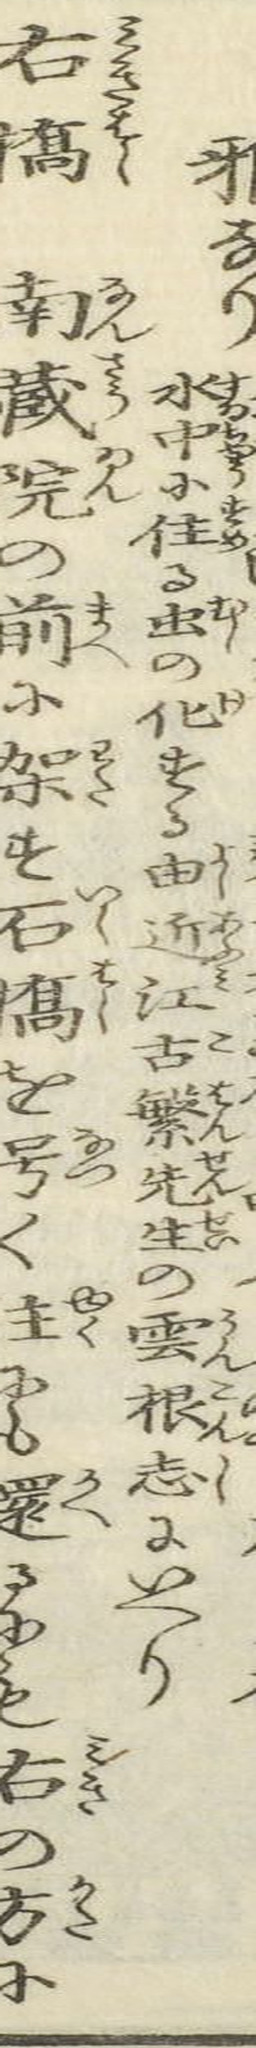右橋南藏院の前に架す石橋を号く往にも還るにも右の方に
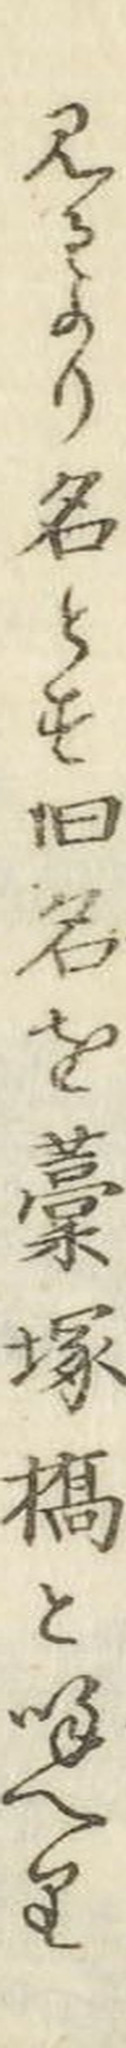見るより名とす旧名を藁塚橋と呼へり
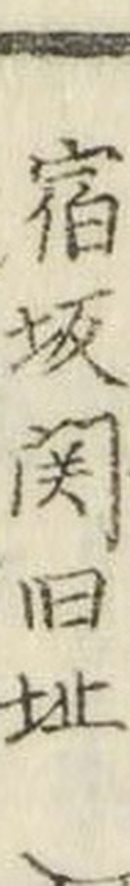宿坂関旧址
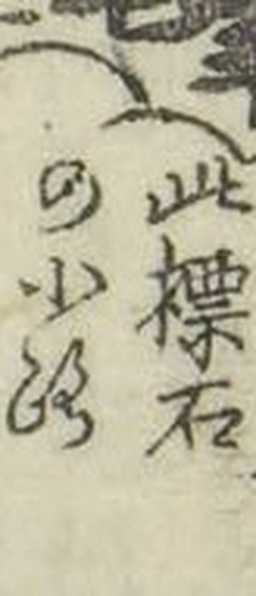の小路
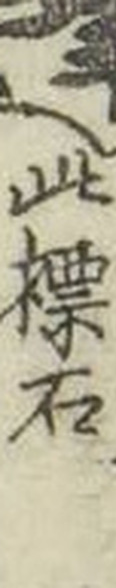此標石
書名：江戸名所図会 20巻 巻之12
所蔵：東京学芸大学教育コンテンツアーカイブ
